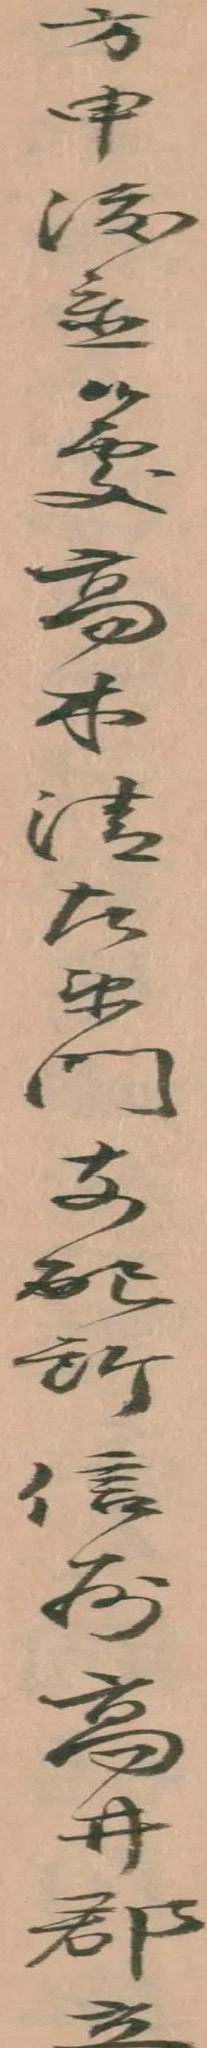方申渡置処高木清左衛門支配所信州高井郡立
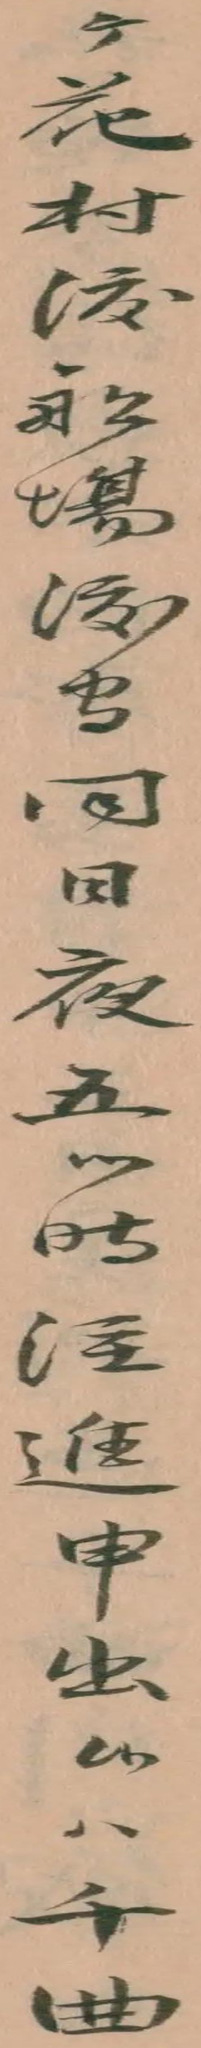ヶ花村渡船場守同日夜五ッ時注進申出候ハ千曲
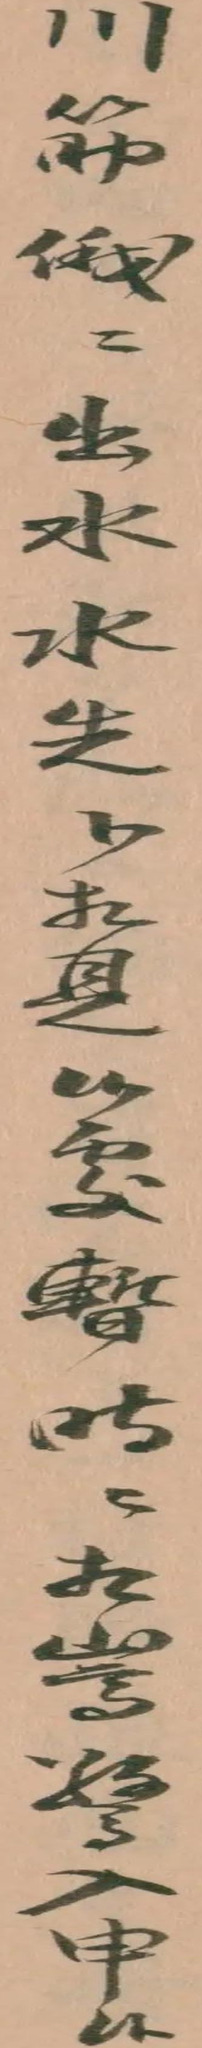川筋俄二出水水先ト相見候処暫時二相嵩驚入申候
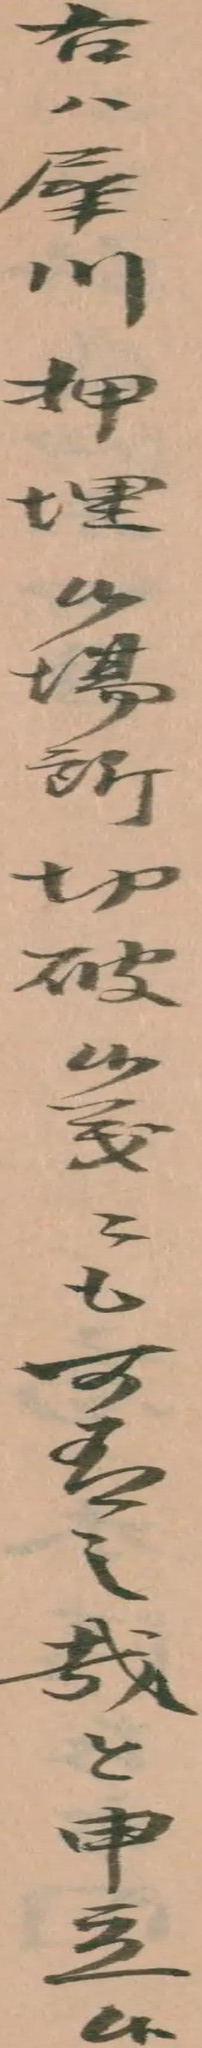右ハ犀川押埋候場所切破候儀二も可有之哉と申立候
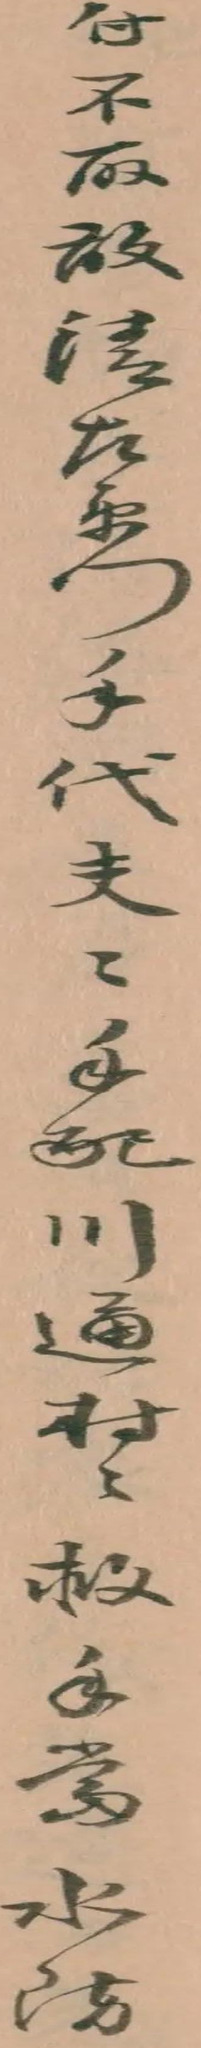付不取敢清左衛門手代夫々手配川通村々救手当水防
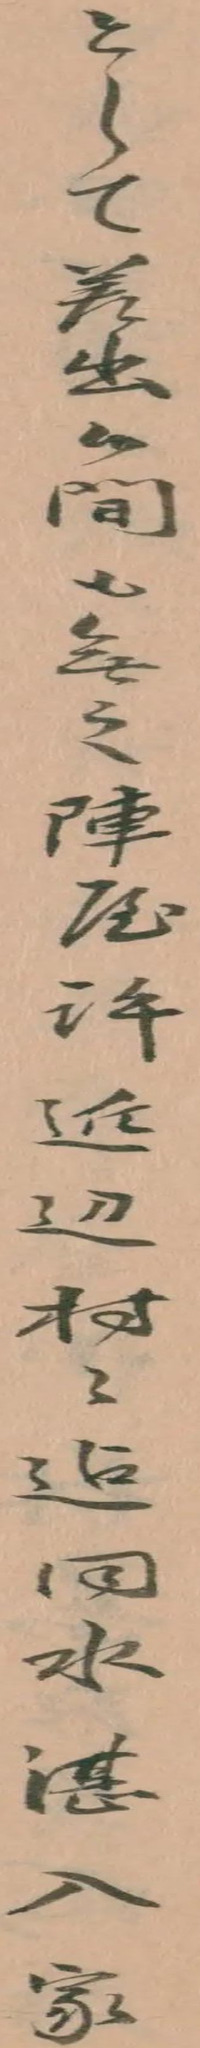として差出候間も無之陣屋許近辺村々迄同水湛入家
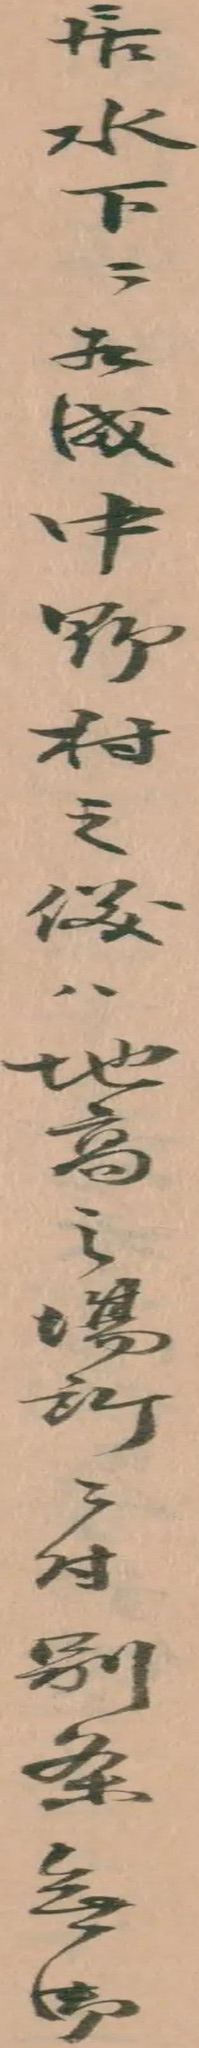居水下二相成中野村之儀ハ地高之場所二付別条無御
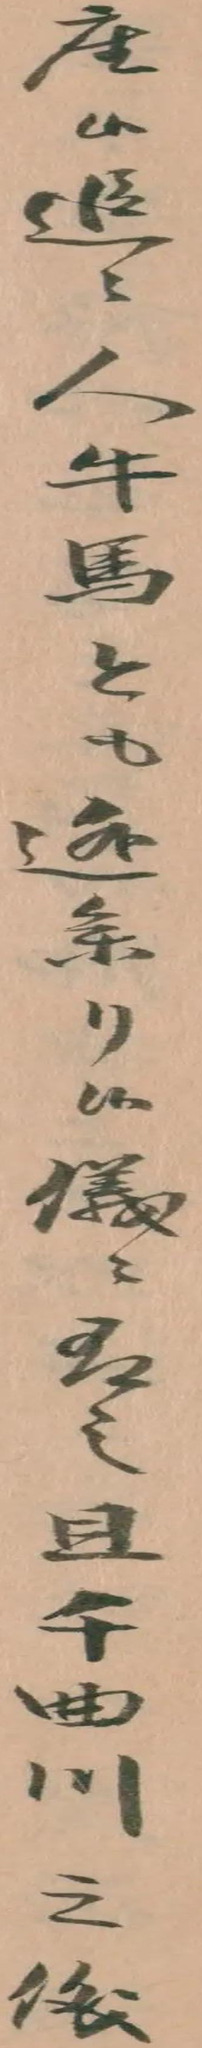座候追々人牛馬とも逃参り候儀二有之且千曲川之儀
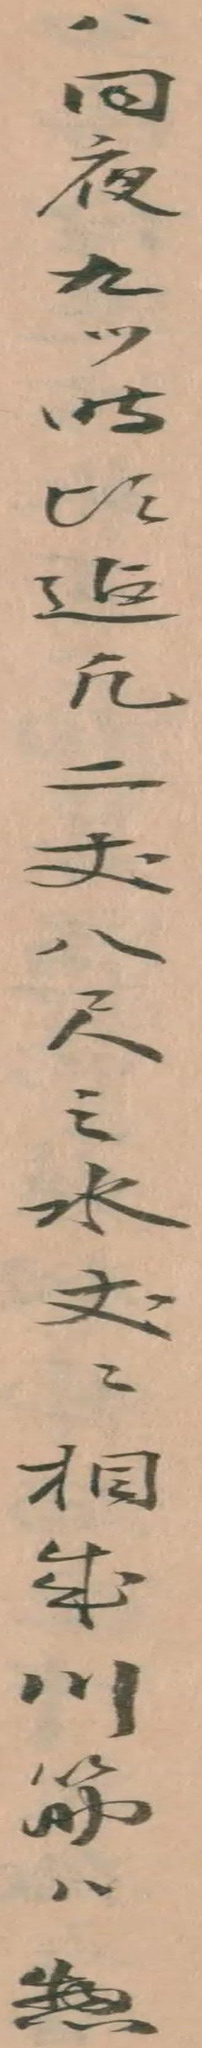ハ同夜九ッ時頃迄凡弐丈八尺之水丈二相成川筋ハ惣
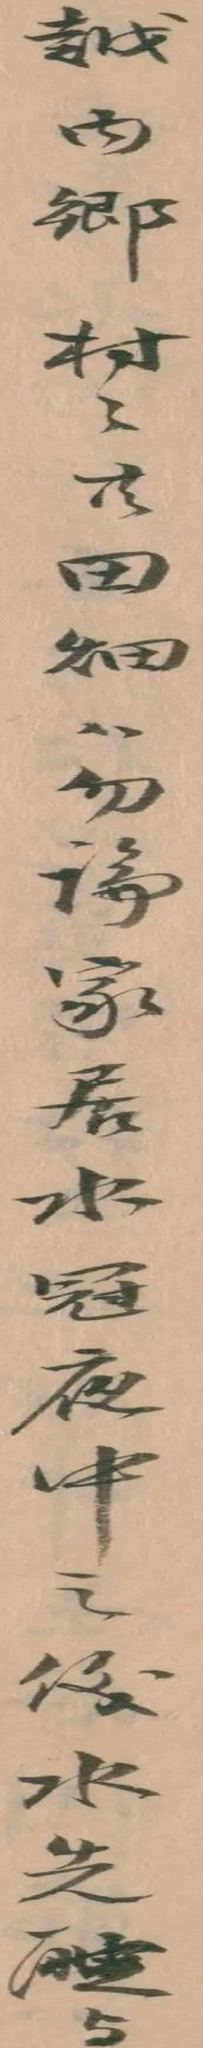越内郷村々共田畑ハ勿論家居水冠夜中之儀水先̪碇と
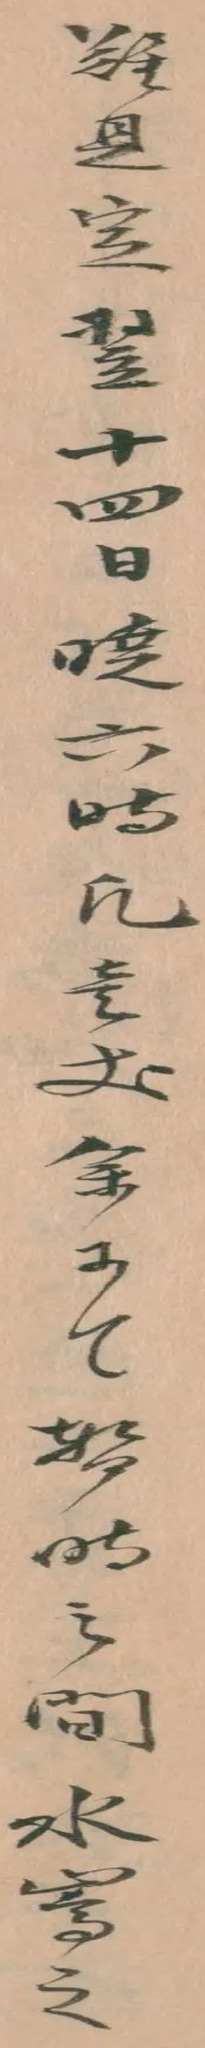難見定翌十四日暁六時凡壱丈余にて暫時間水嵩之
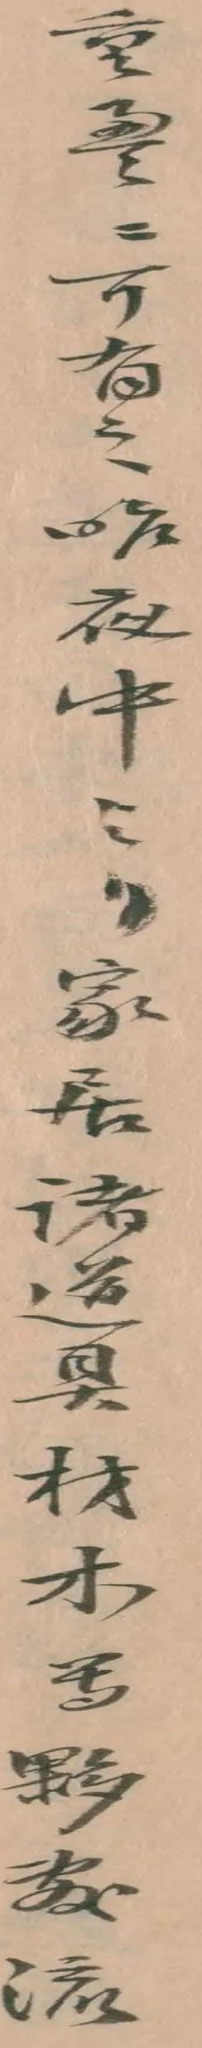重畳二可有之昨夜中ゟ家居諸道具材木等夥敷流
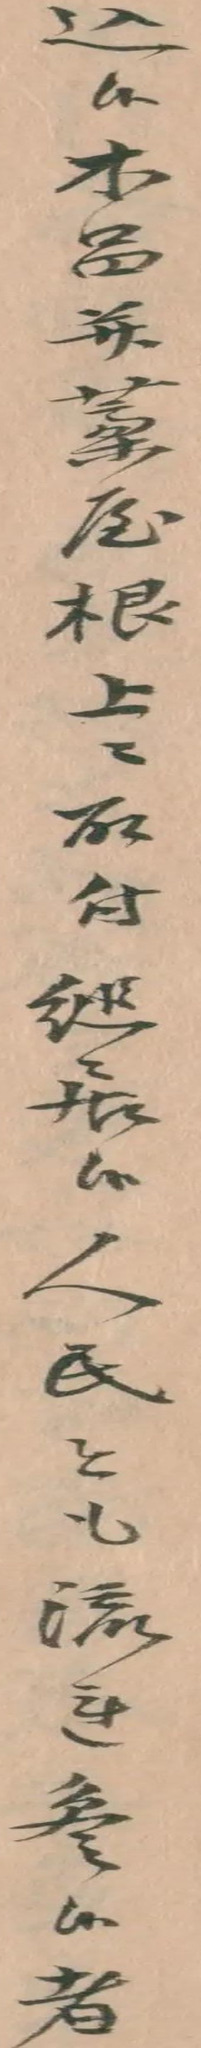込候木品并藁屋根上二取付縋居候人民とも流れ参候者
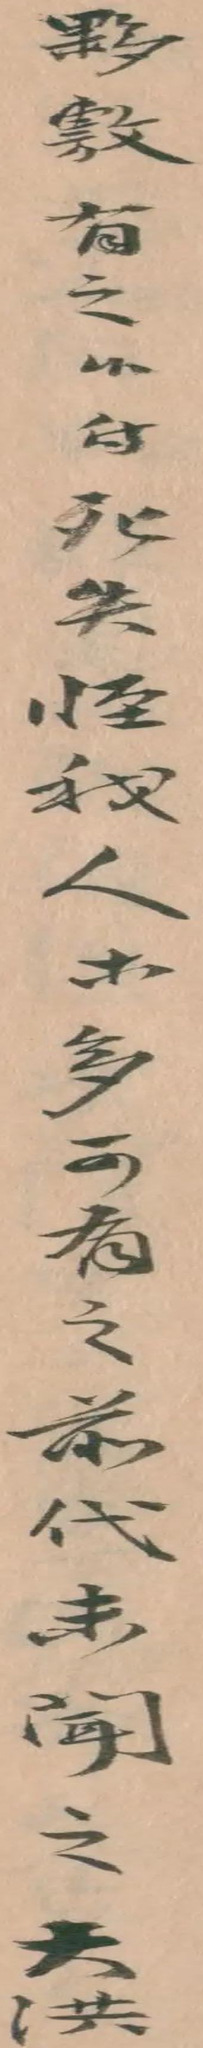夥敷有之候付死失怪我人等多可有之前代未聞之大洪

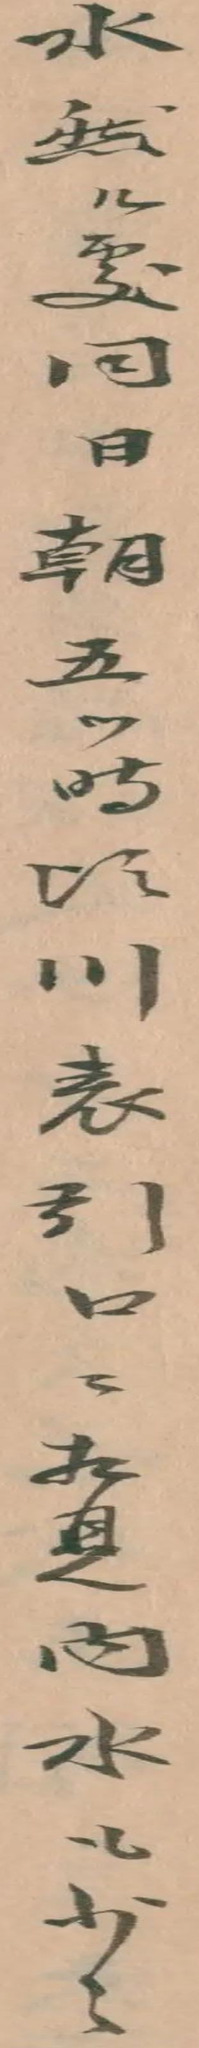水然処同日朝五ッ時頃川表引口二相見内水も少々
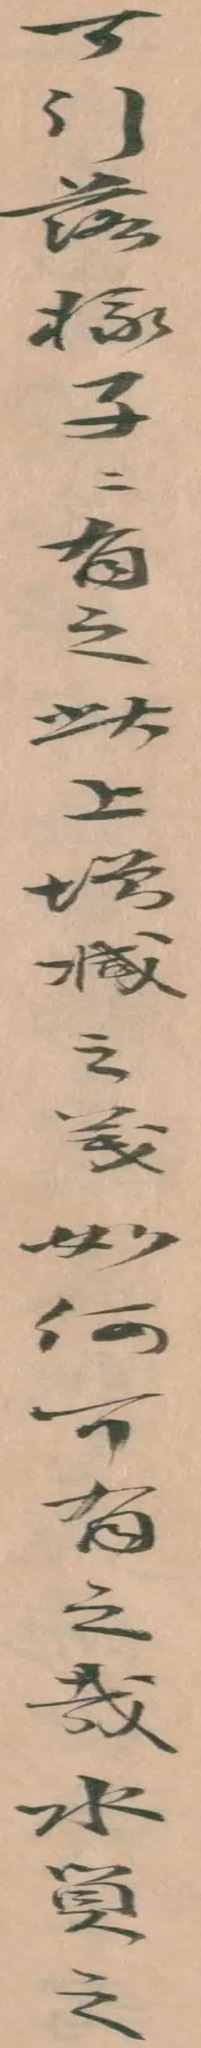可引落様子二有之此上増減之儀如何可有之哉水災之
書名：地災撮要. 巻3(地震之部)-巻4(噴火之部)
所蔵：国立国会図書館 National Diet Library, JAPAN
